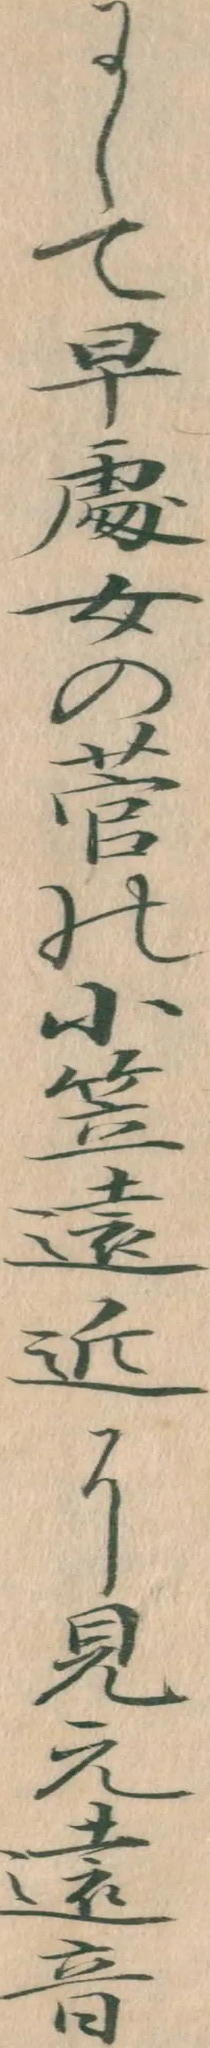にして早処女の菅の小笠遠近に見え遠音
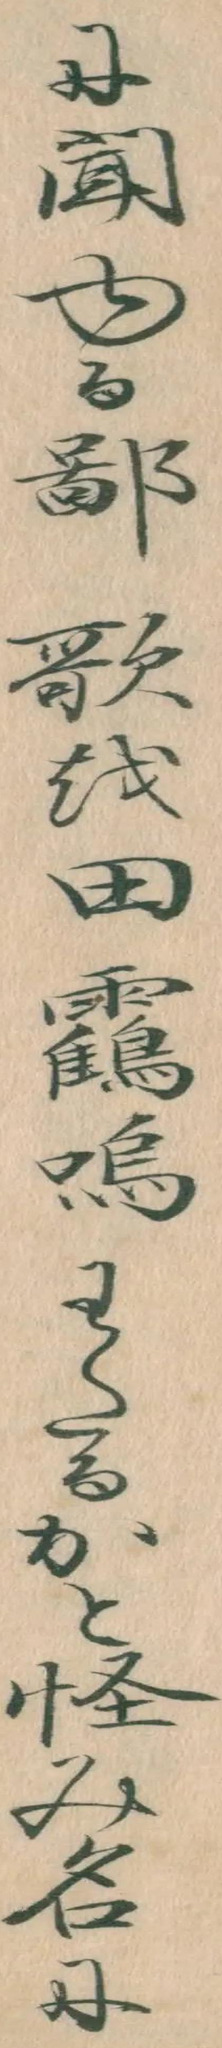に聞ゆる鄙歌を田鶴鳴わたるかと怪み名に
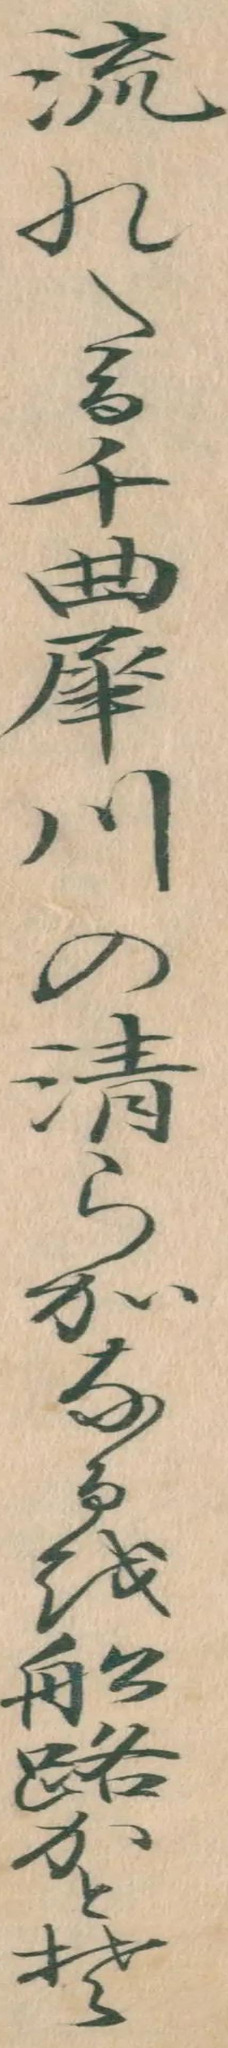流れたる千曲犀川の清らかなるを船路かとそ
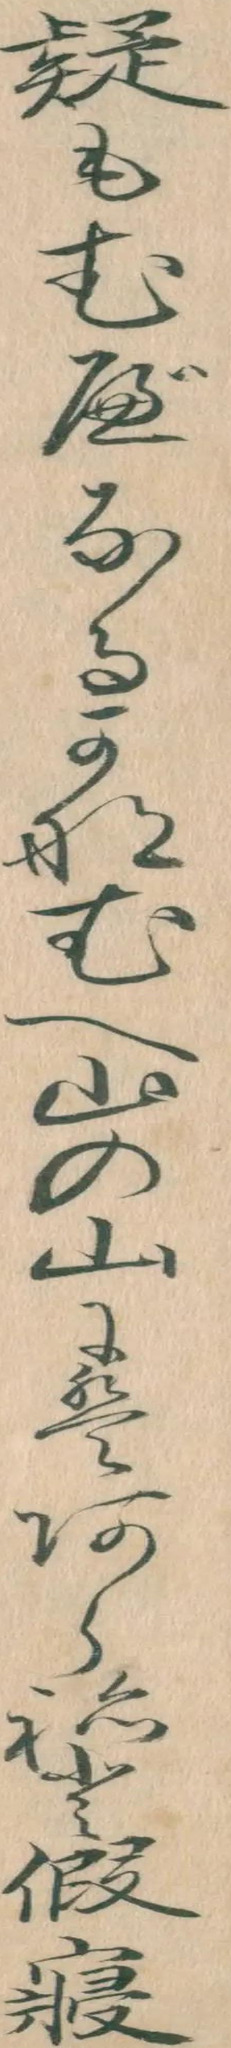疑もむべなるかなむへ山の山にはあらねと仮寝
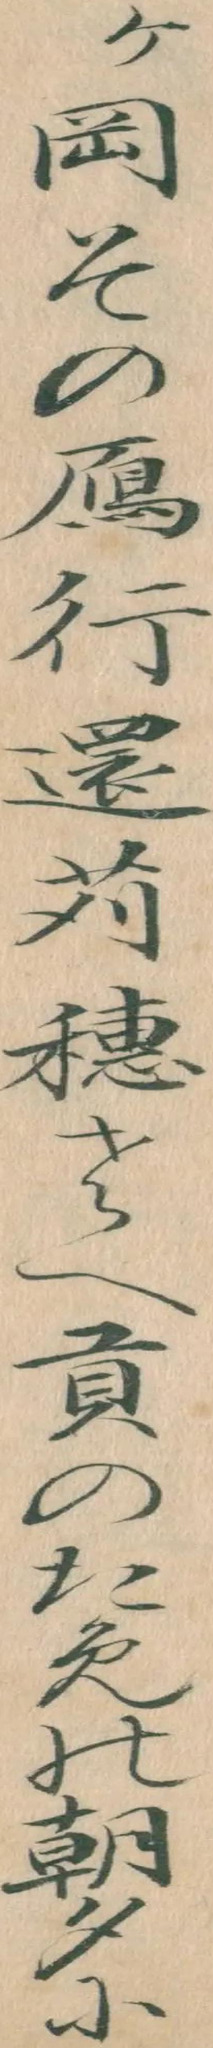ヶ岡その鴈行還苅穂さへ貢のための朝夕に
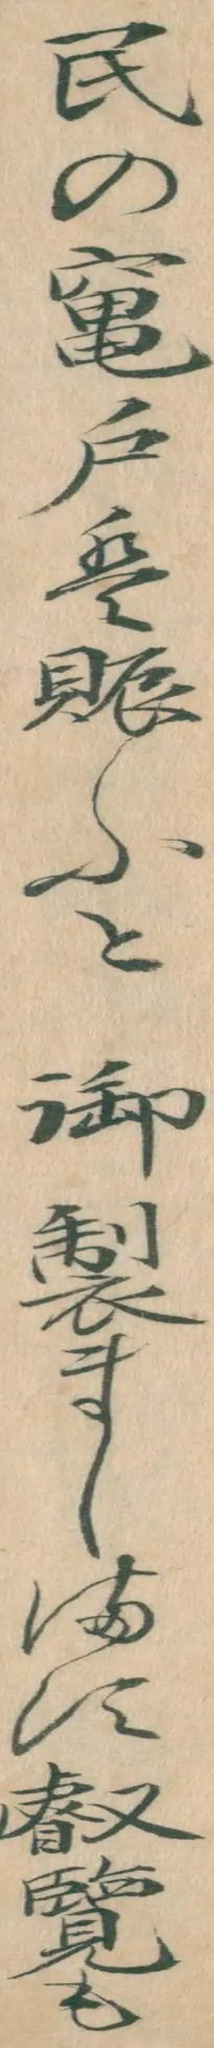民の竃戸は賑ふと御製まします叡覧も

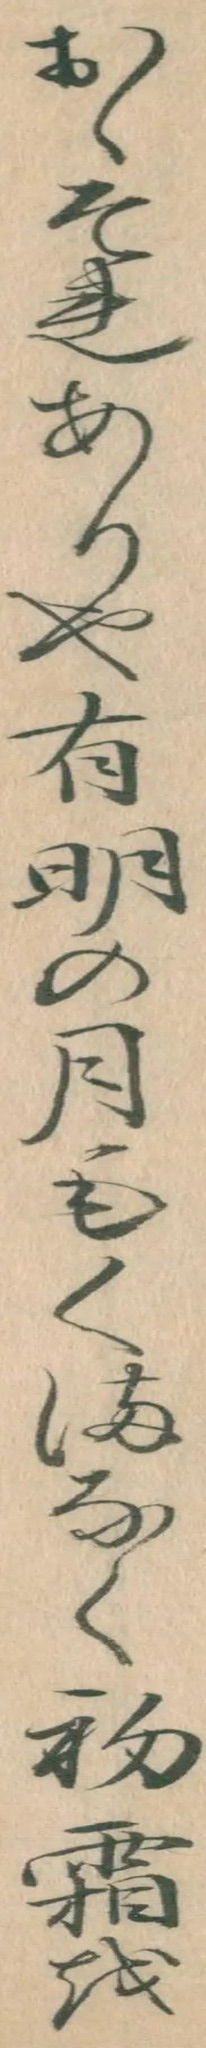おゝそれありや有明の月もくまなく初霜を
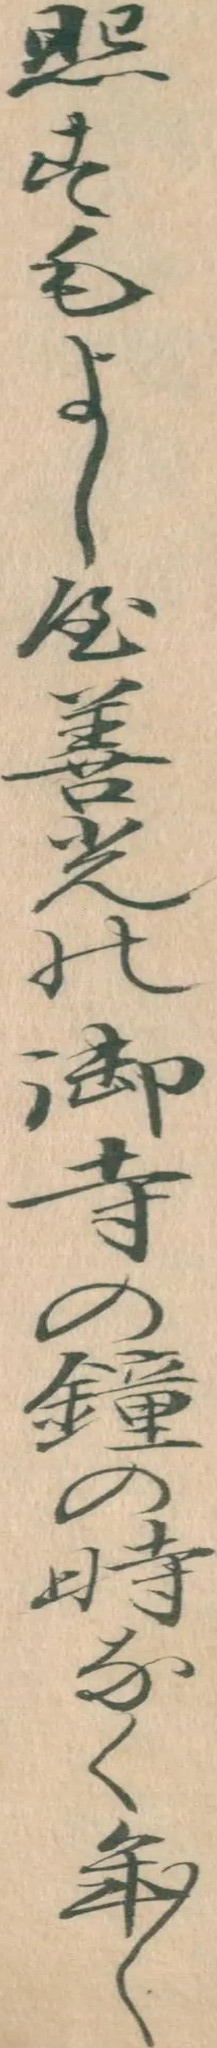照すもよしや善光の御寺の鐘の時なく年〳〵
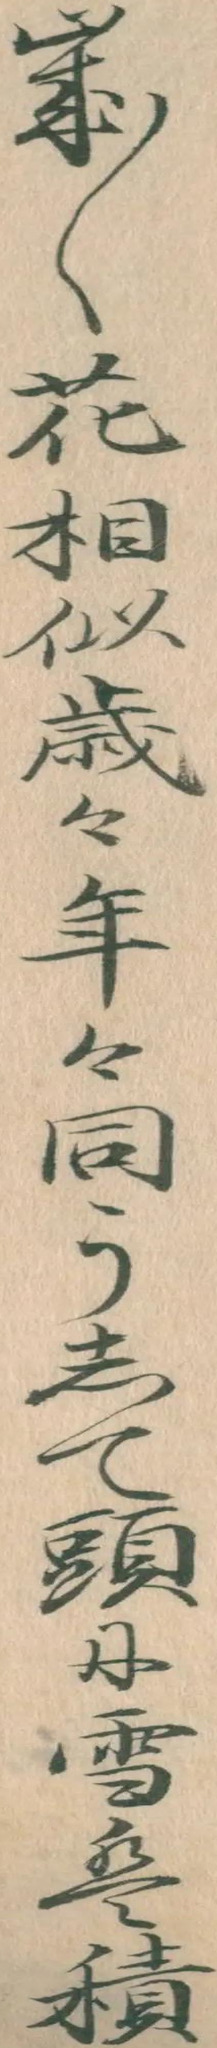歳〳〵花相似歳々年々同じうして頭に雪は積
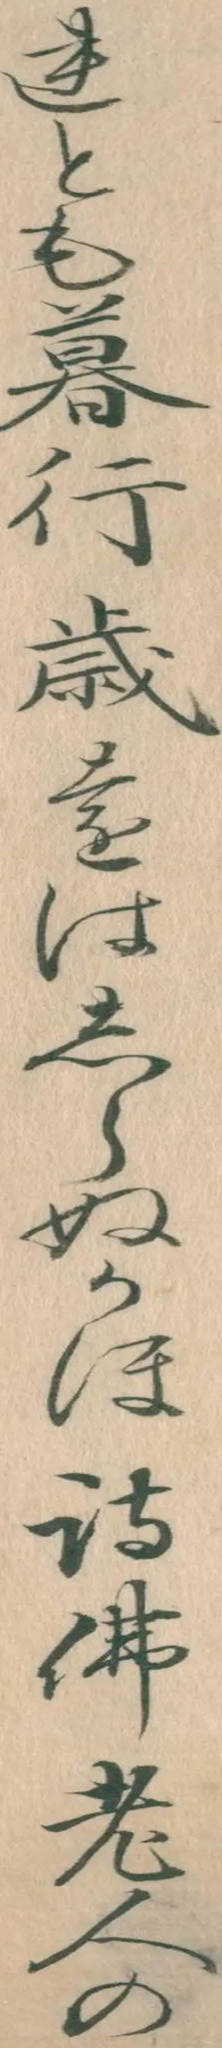れとも暮行歳をはしらぬかほ詩仏老人の
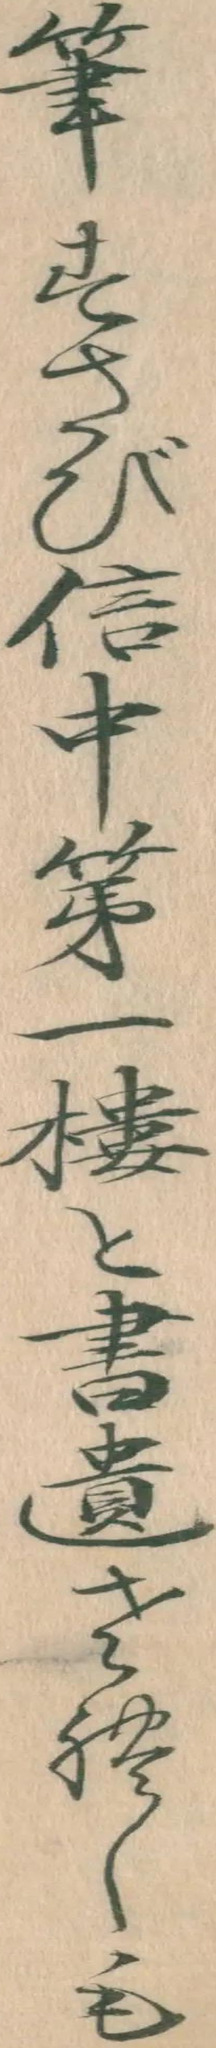筆すさび信中第一楼と書遺されしも
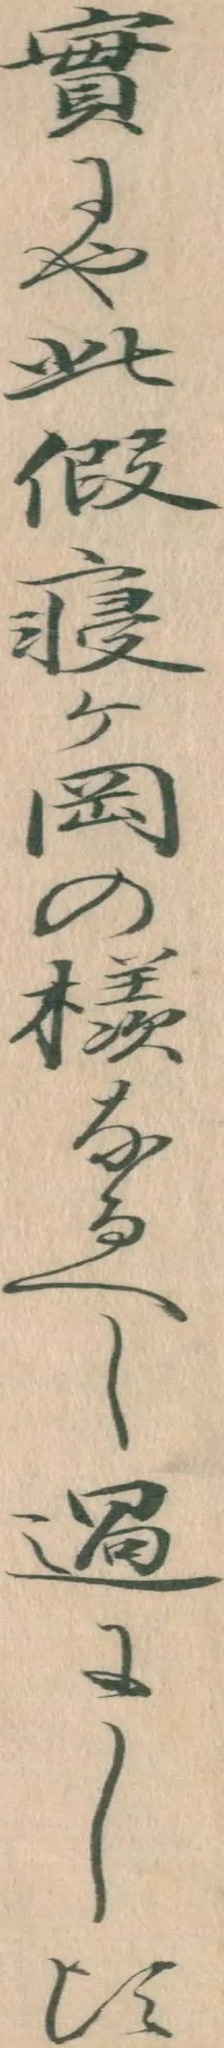実にや此仮寝ヶ岡の様なるへし過にし頃
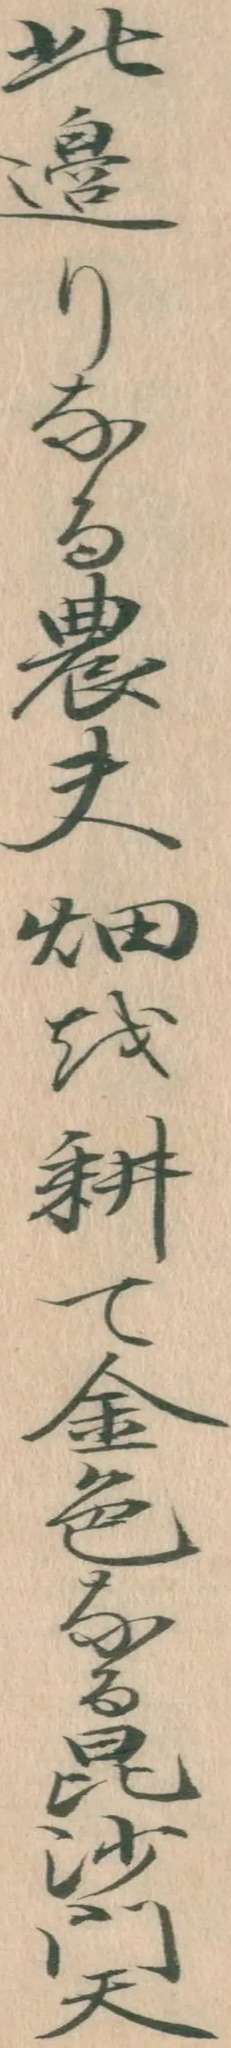此辺りなる農夫畑を耕て金色なる毘沙門天
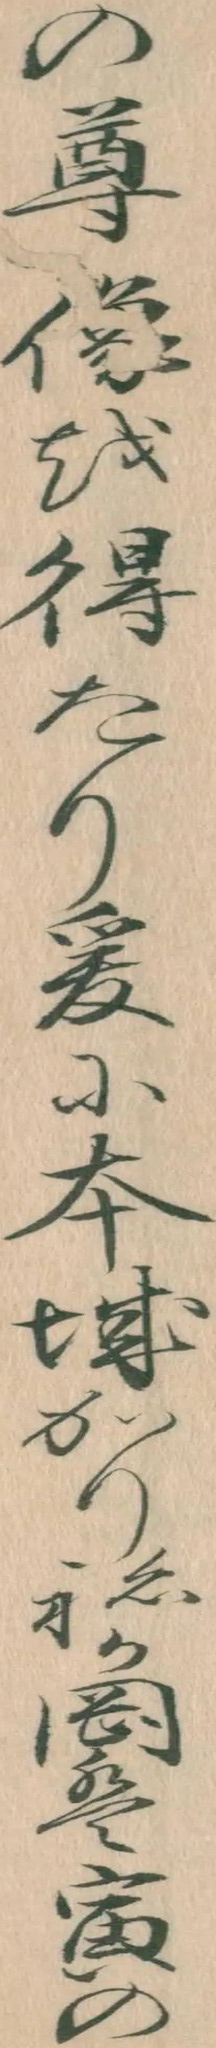の尊像を得たり爰に本城かりねか岡は寅の
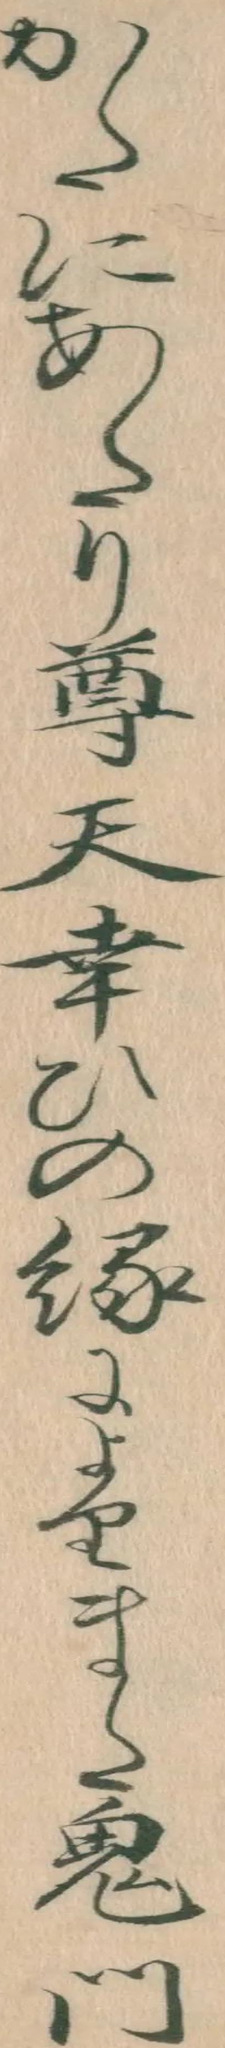かたにあたり尊天幸ひの縁によりまた鬼門
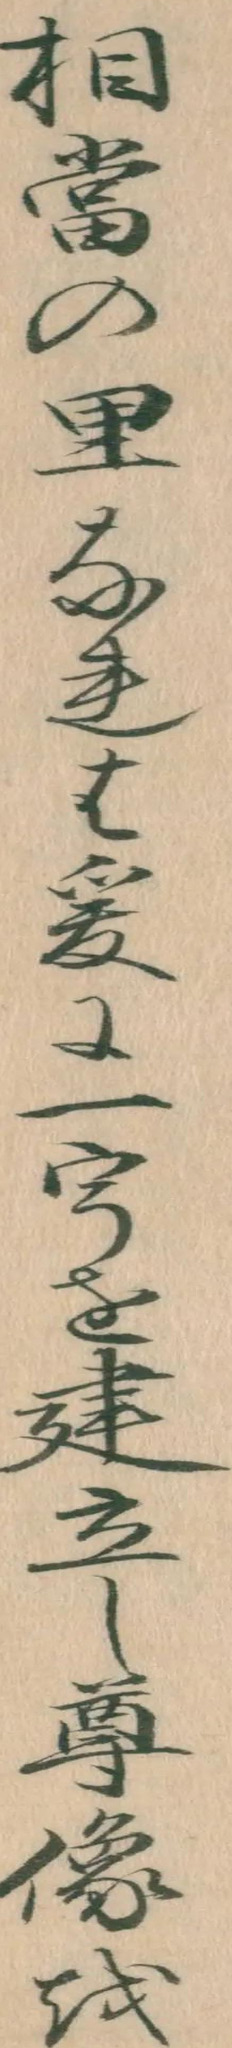相当の里なれは爰に一宇を建立し尊像を
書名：俗語之種. [3]
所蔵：国立国会図書館 National Diet Library, JAPAN
